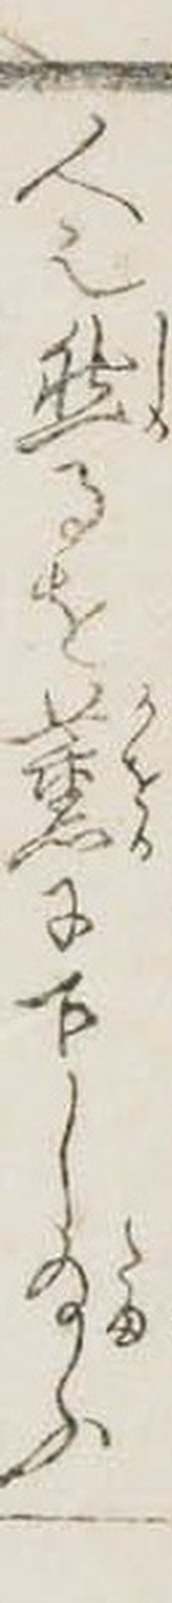人也然るを薫に下し給ふ
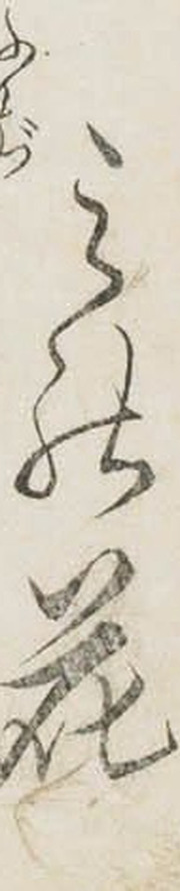みの花
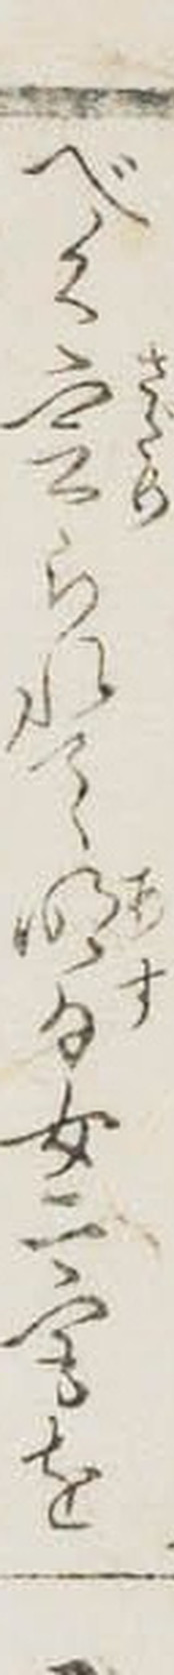べく定られて明日女二宮を
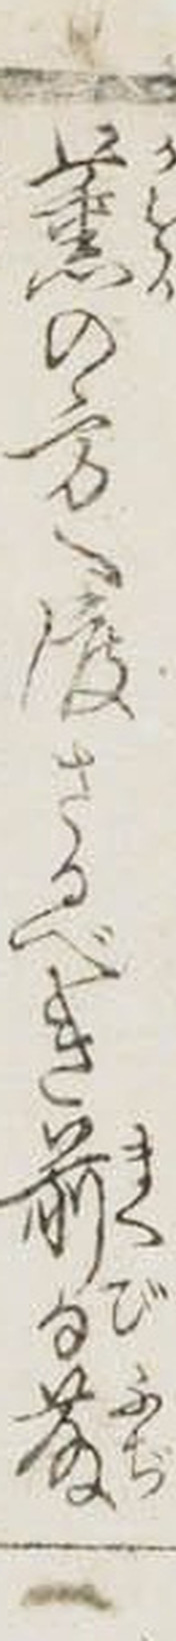薫の方へ渡さるべき前日藤
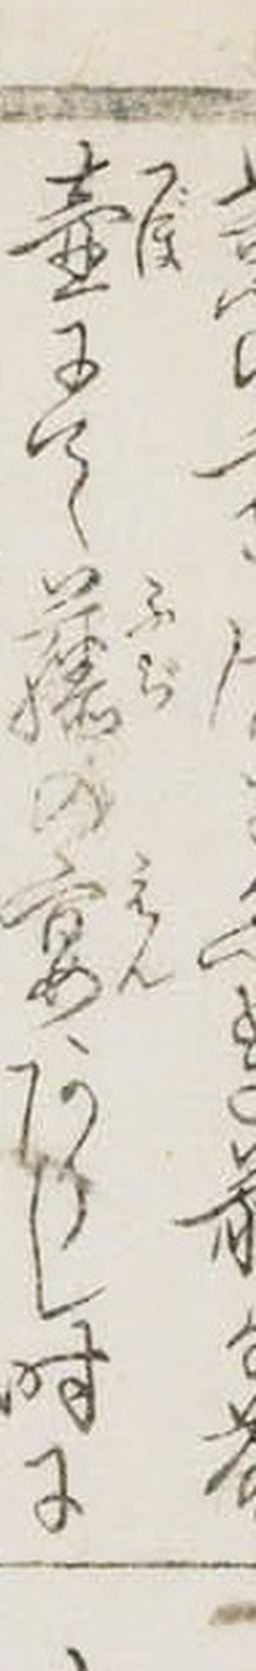壺にて藤の宴ありし時に
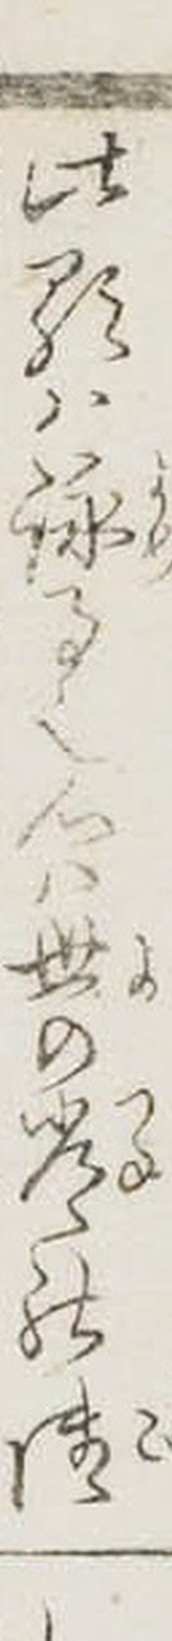此歌は詠る也心は世の常の御
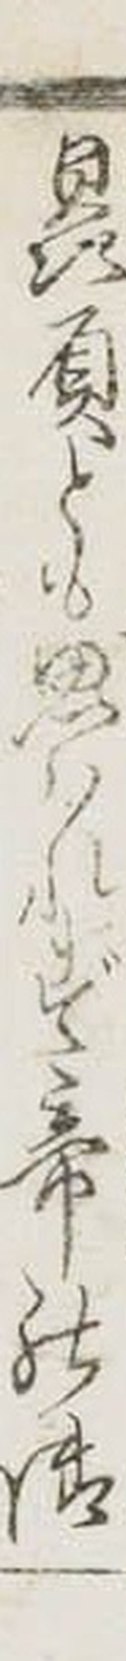贔屓とも思はれず帝の御
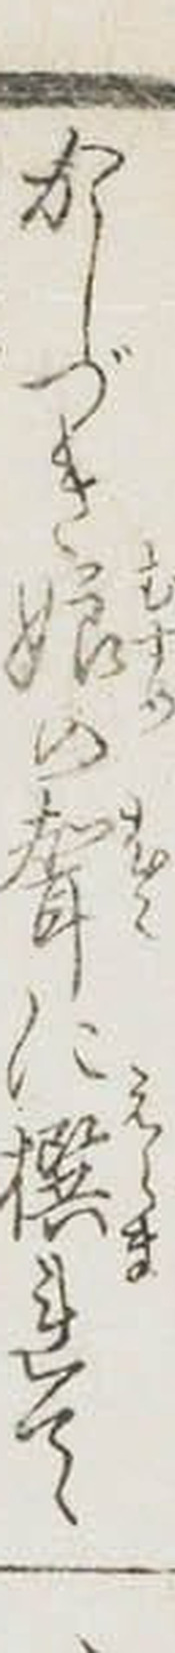かしづき娘の聟に撰れて
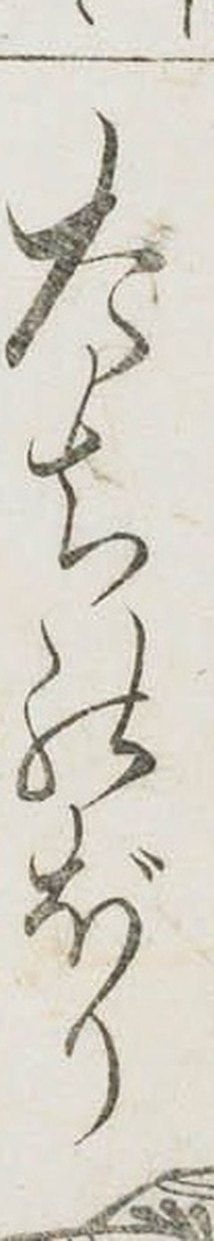たちのぼり
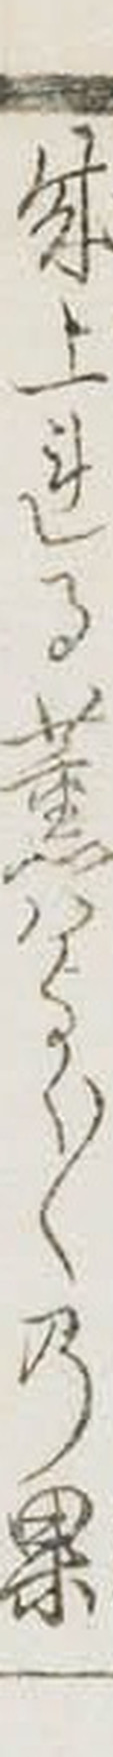成上れる薫はよく〳〵の果
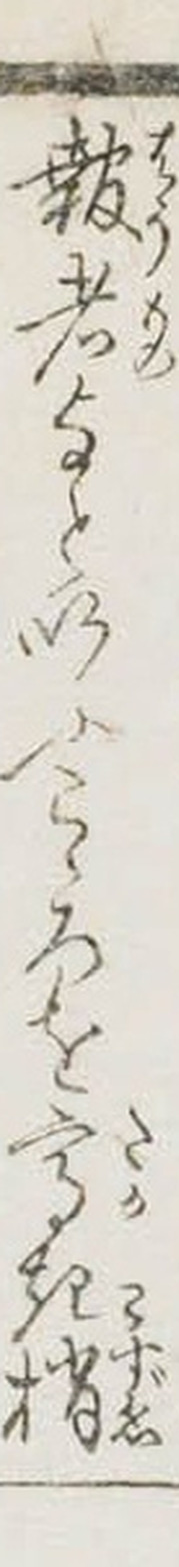報者よといふこゝろを高き梢
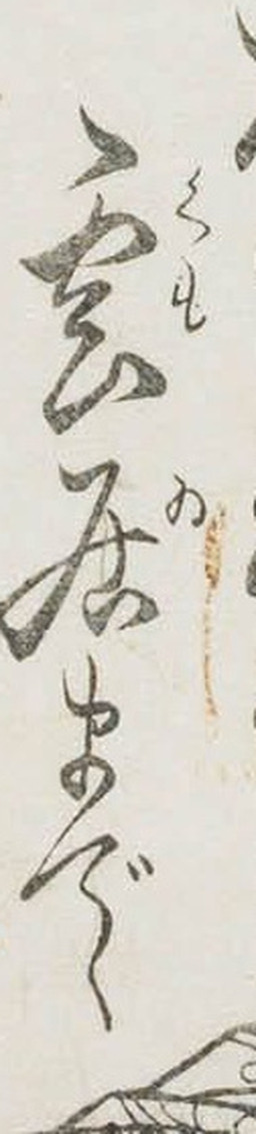雲居まで
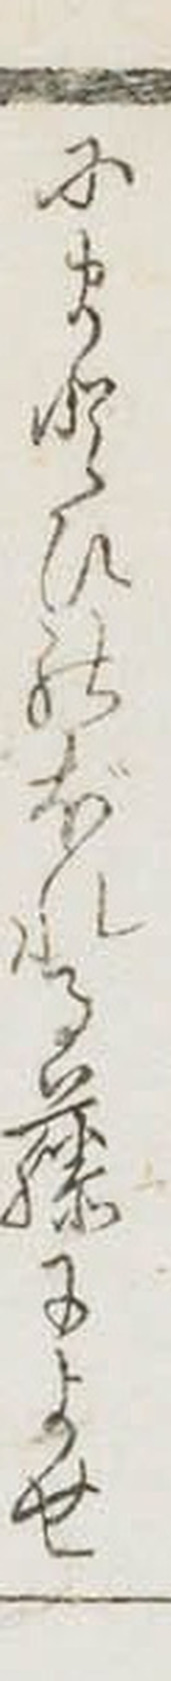にまとひのぼのぼれる藤によせ
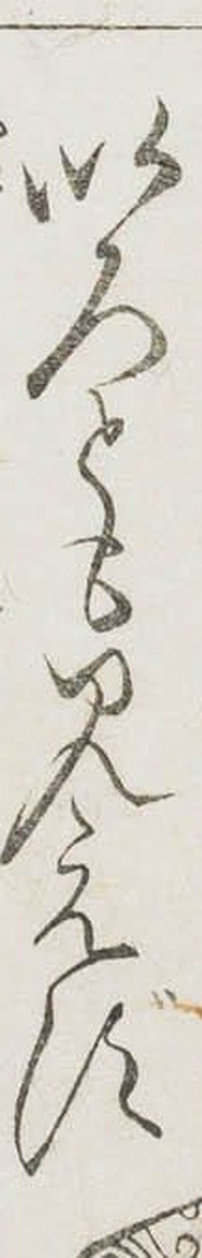いろとも見えず
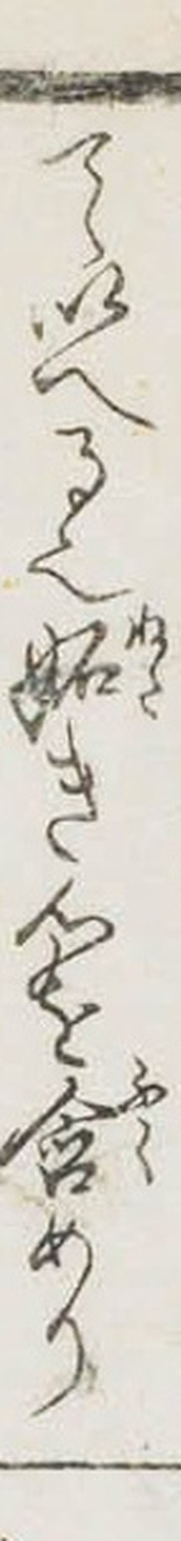ていへる也妬き心を含めり
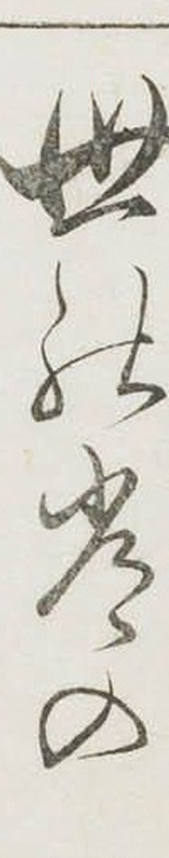世の常の
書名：源氏百人一首
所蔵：東京学芸大学教育コンテンツアーカイブ
